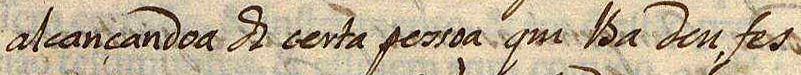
alcançandoa de certa pessoa que lha deu, fes
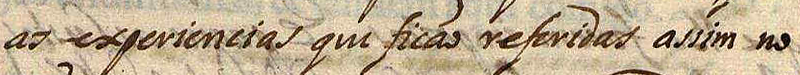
as experiencias que ficão referidas assim no
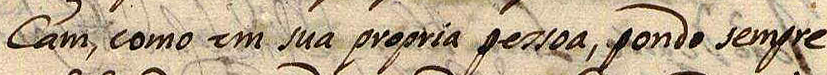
cám, como em sua propria pessoa, pondo sempre
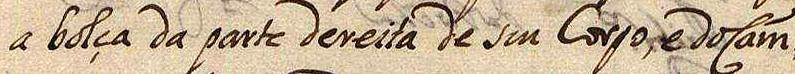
a bolça da parte dereita de seu Corpo, e do Cám,
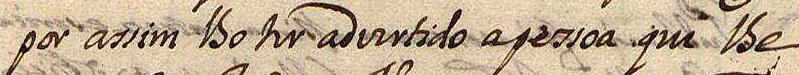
por assim lho ter advertido a pessoa que lhe
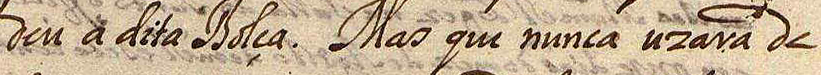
deu a dita Bolça. Mas que nunca uzara de
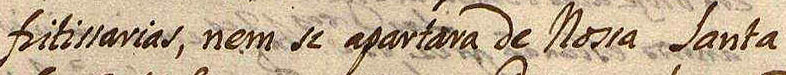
feitissarias, nem se apartara de Nossa Santa
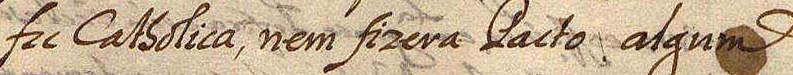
fee Catholica, nem fizera Pacto algum
